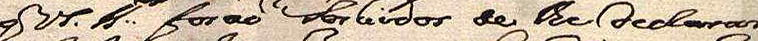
q̄ VS SS.as foraõ seruidos de lhe declarar
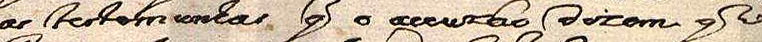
as testemunhas q̄ o accuzaõ dizem q̄ o
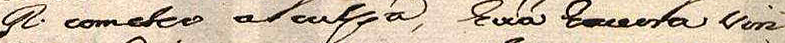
R. cometeo a culpa, huā hauera vin
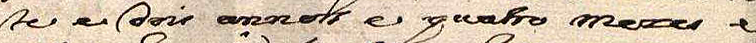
te e dois annos e quatro mezes e
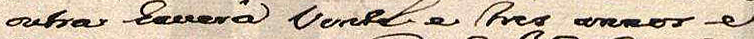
outra hauerá vinte e tres annos e
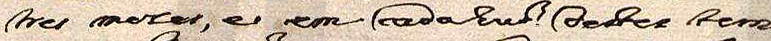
tres mezes, e em cada huā destes tem
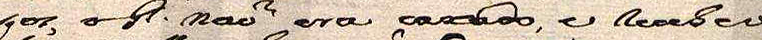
pos, o R. naõ era cazado, e recebeo
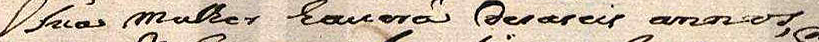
sua mulher hauerá desaseis annos,
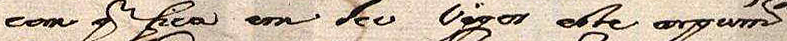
com q̄ fica em seo vigor este argumto.
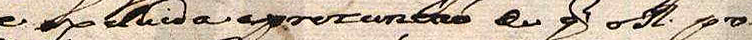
e excluida a prezunçaõ em q̄ o R. po
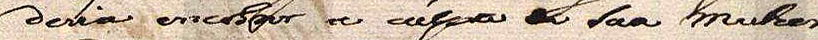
deria encobrir a culpa a sua mulher
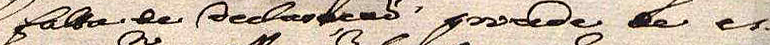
falta de declaraçaõ proceda de es
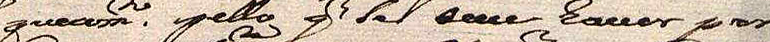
quecimto. pello q̄ se deue hauer por
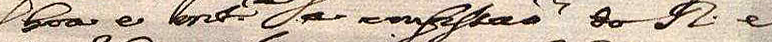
boa e ent.ra a confissaõ do R. e
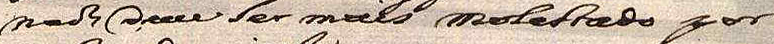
naõ deue ser mais molestado por
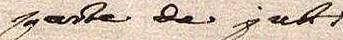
parte da justi
